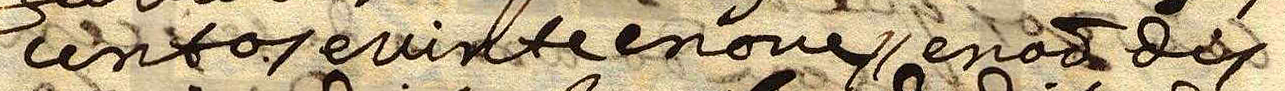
centos e uinte e noue // e naõ dis
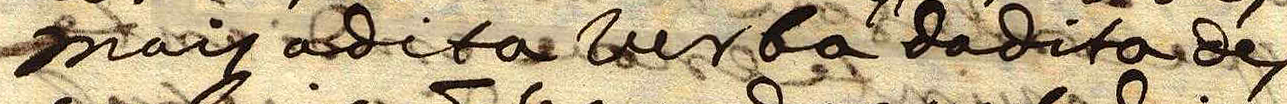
mais a dita verba da dita des
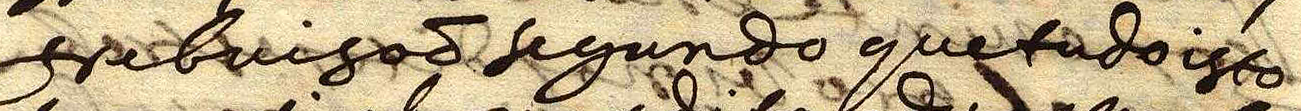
trebuisaõ segundo que tudo isto
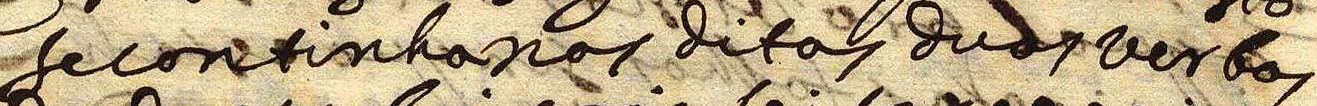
se continha nas ditas duas verbas
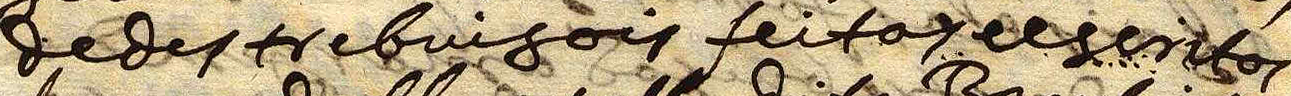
de destrebuisois feitas e escritas
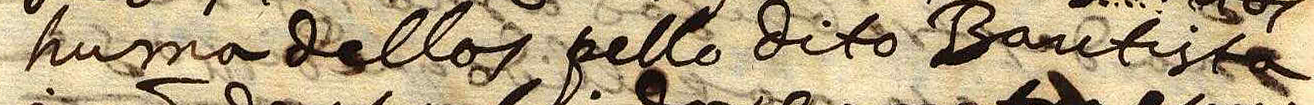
huma dellas pello dito Bautista
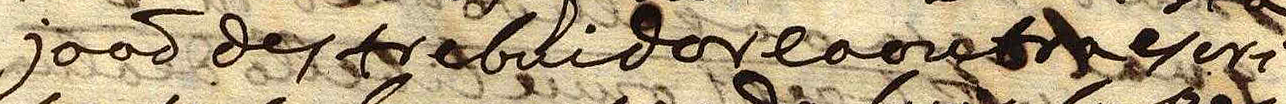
joaõ destrebuidor e a outra escri
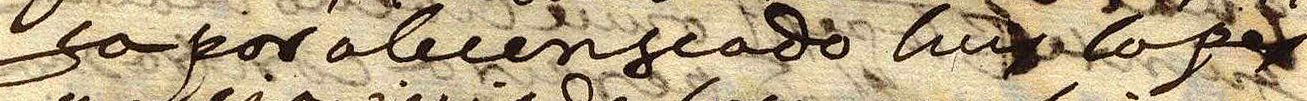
ta por o lecenseado luis lopes
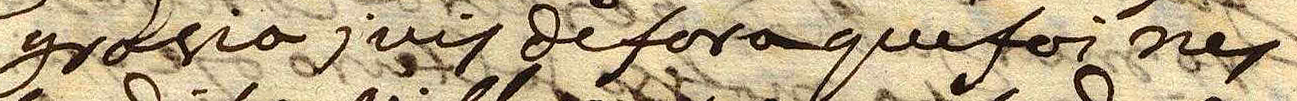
grasia juis de fora que foi nes
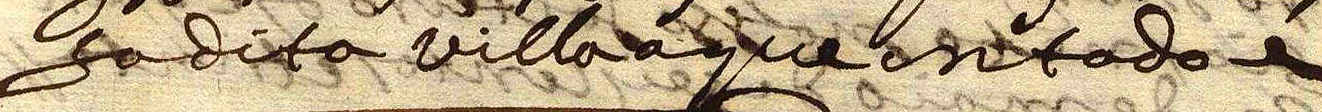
ta dita villa a que en todo e
